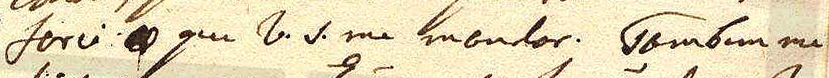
farei o que V. s. me mandar. Tambem me
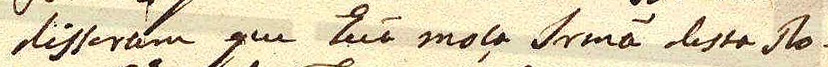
disseram que huā moça Irmã desta Ro
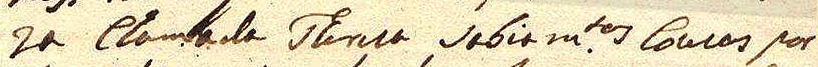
za Chamada Thereza sabia m.tas Couzas por
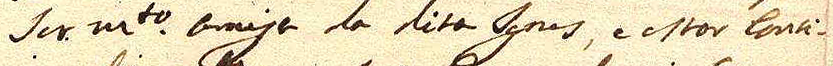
ser mt.o amiga da dita Ignes, e estar Conti
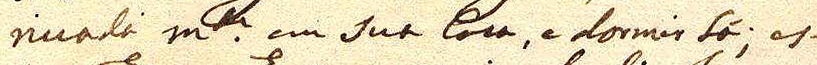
nuada mto. em sua Caza, e dormir lá; es
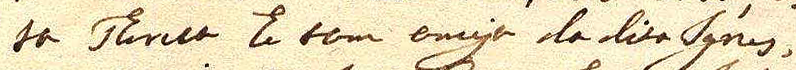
ta Thereza he tam amiga da dita Ignes,
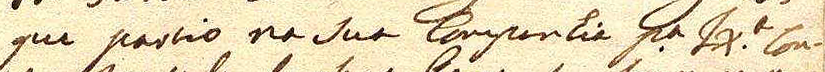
que partio na sua Companhia p.a Lx.a Con
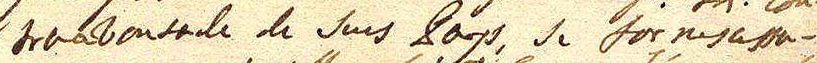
tra a vontade de seus Pays, se for nescessa
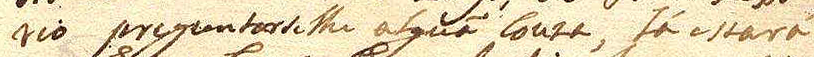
rio preguntarselhe alguā couza, lá estará
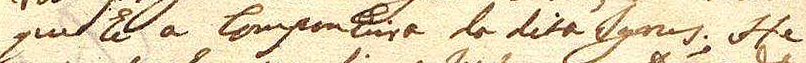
que he a Companheira da dita Ignes; He
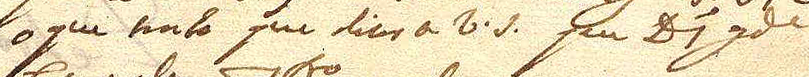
o que tenho que dizer a v. s. que Ds̄ gde
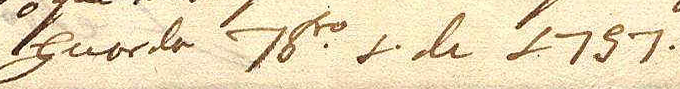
Guarda 7bro 1. de 1757.
